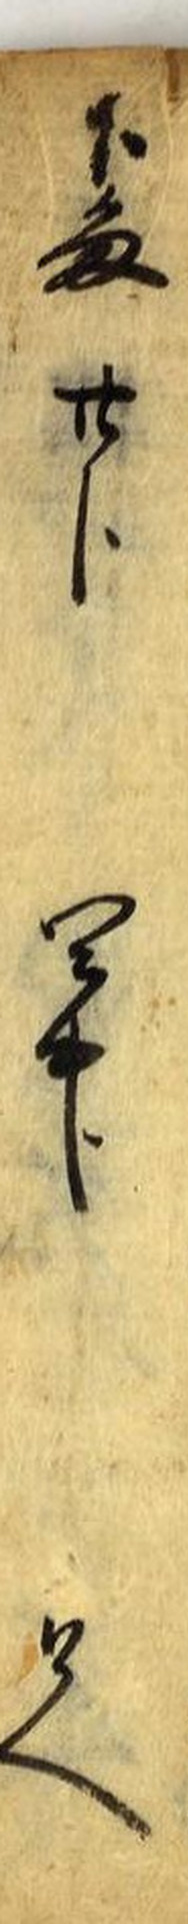下畠廿分四升同人
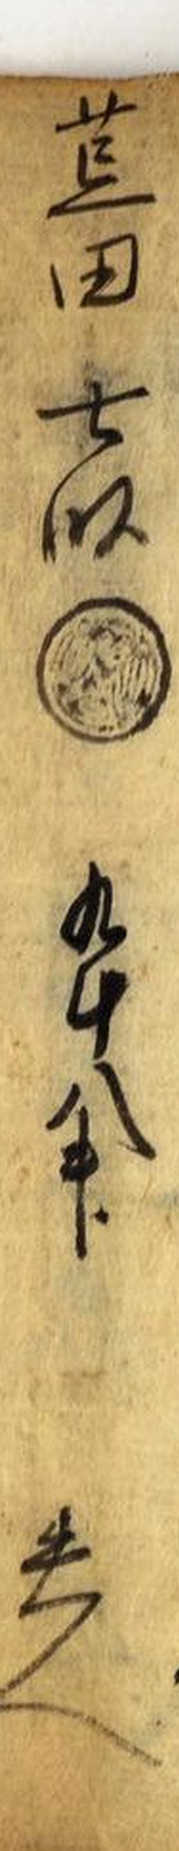荒田七畝㊞九斗八升失人
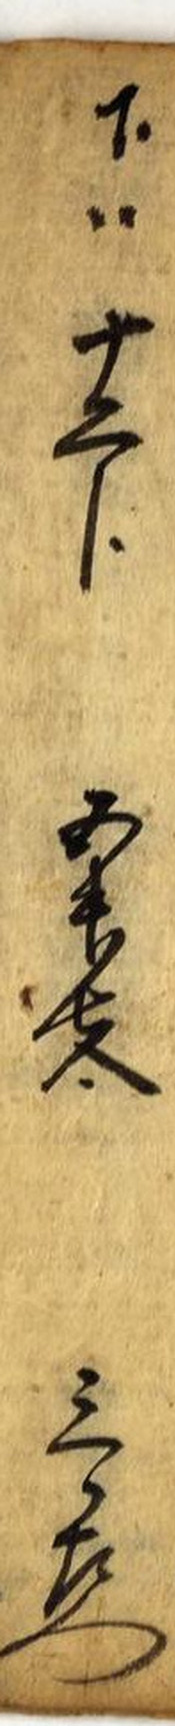下同十二分五升七合三郎左衛門
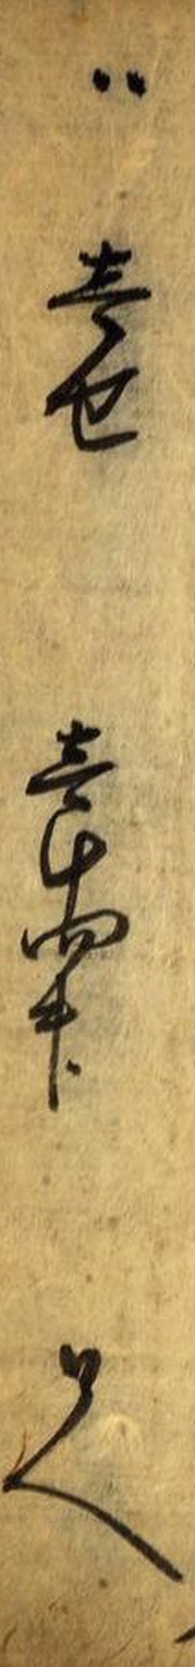同壱セ壱斗四升同人
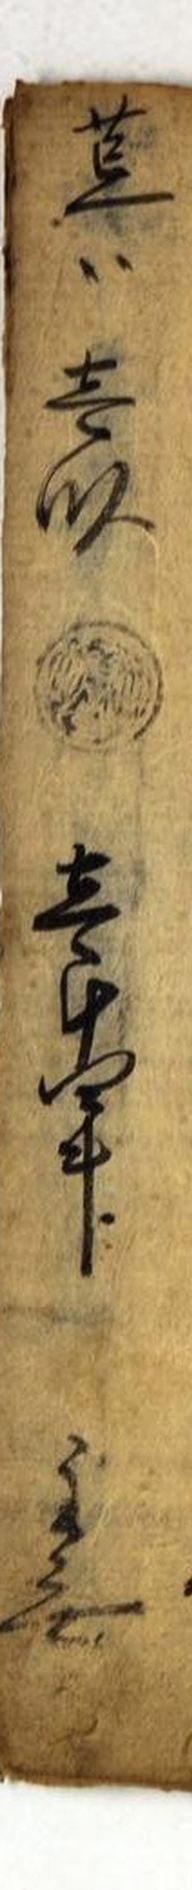荒同壱畝㊞壱斗四升主無

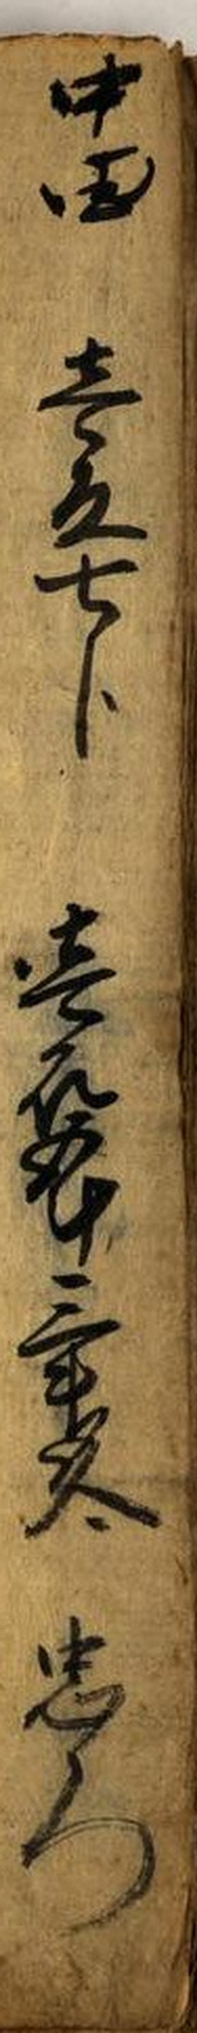中田壱反七分壱石五斗三升五合忠右衛門
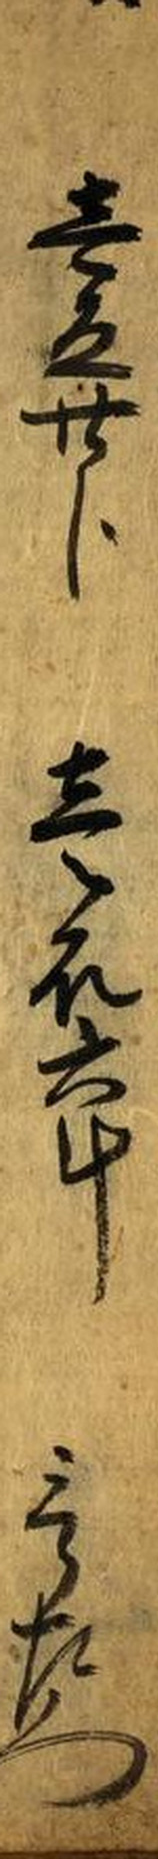同壱反廿分壱石六斗三郎左衛門
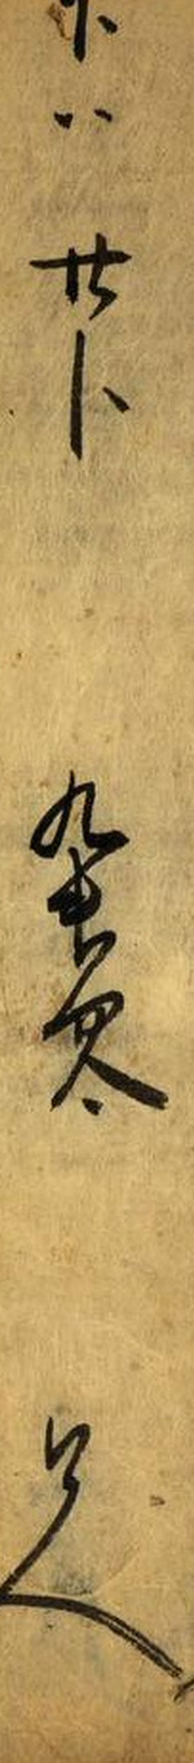下同廿分九升四合同人
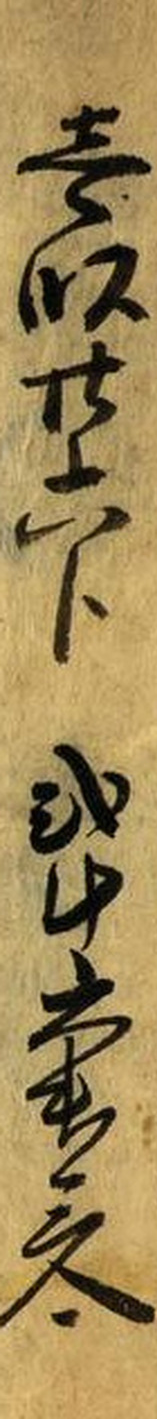同壱畝廿六分弐斗六升三合同人
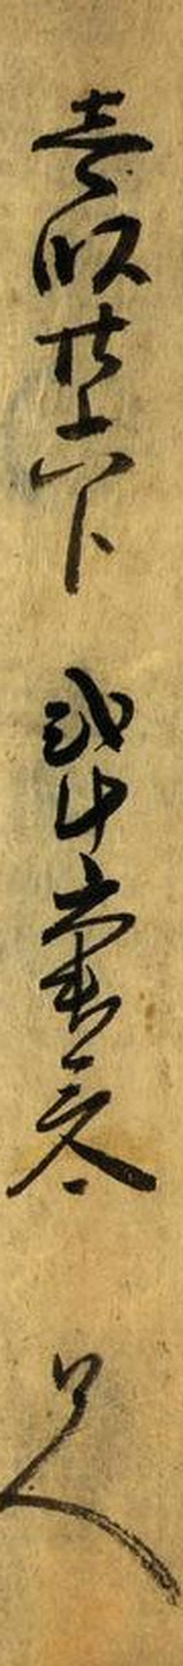同壱畝廿六分弐斗六升三合同人
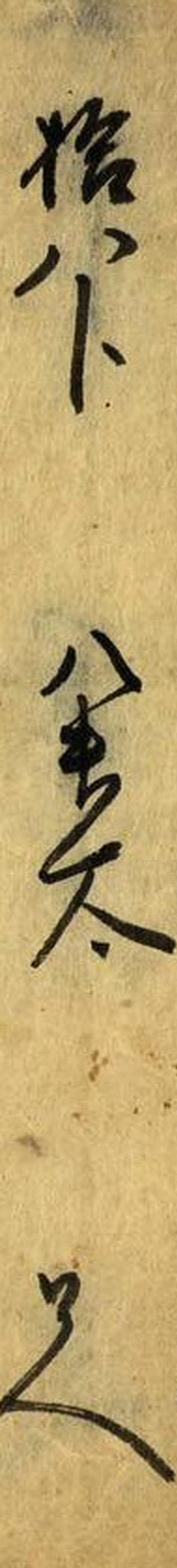同拾八分八升一合同人
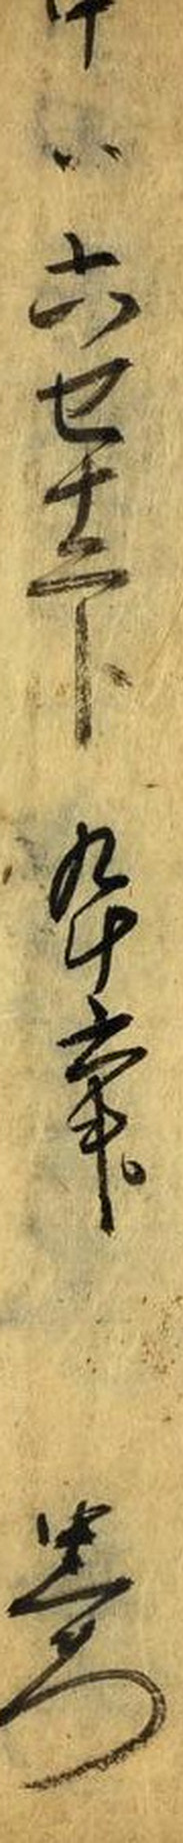中同六セ十二分九斗六升忠右衛門
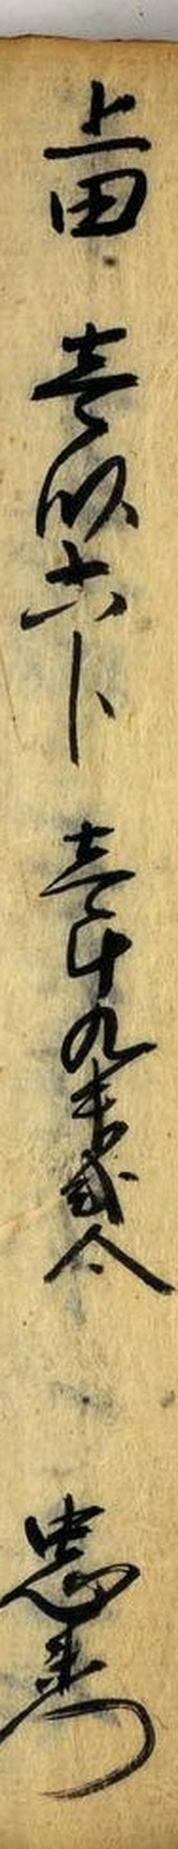上田壱畝六分壱斗九升弐合忠右衛門
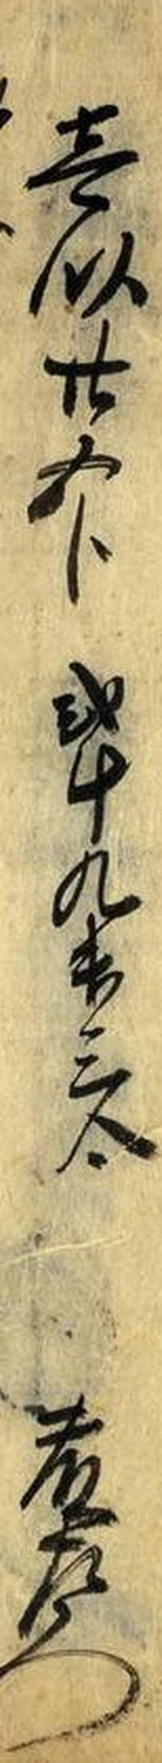同壱畝廿五分弐斗九升三合藤左衛門
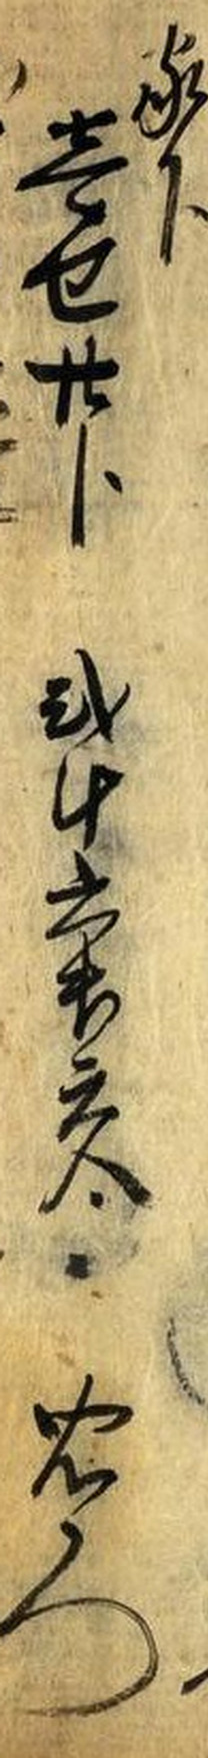同壱セ廿分弐斗六升六合忠右衛門
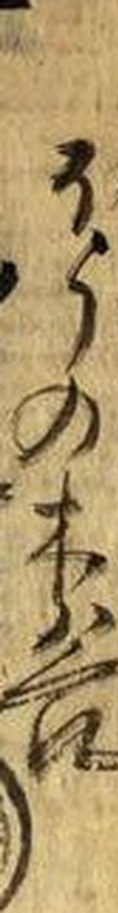ほうの木谷
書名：越前国西方内志津庄内本折村御検地帳
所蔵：福井県文書館 Fukui Prefectural Archives
